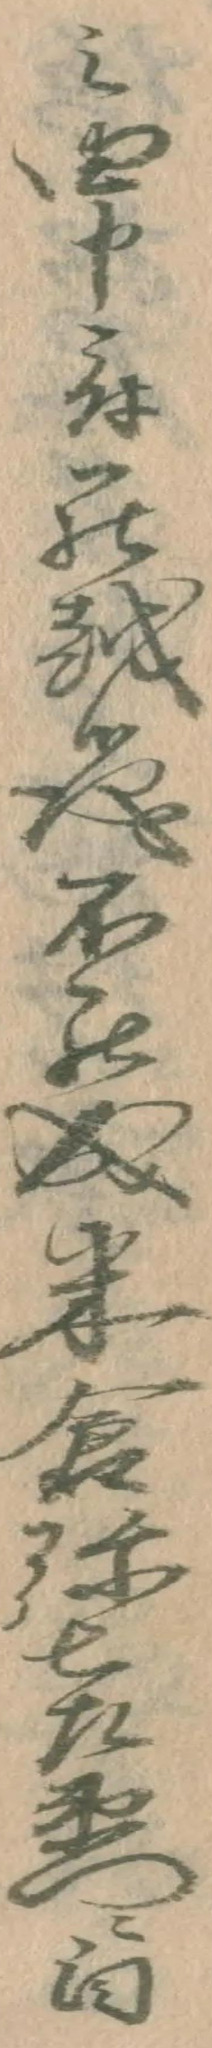之由申に付罷越候儀不罷成米倉弥七左衛門に自
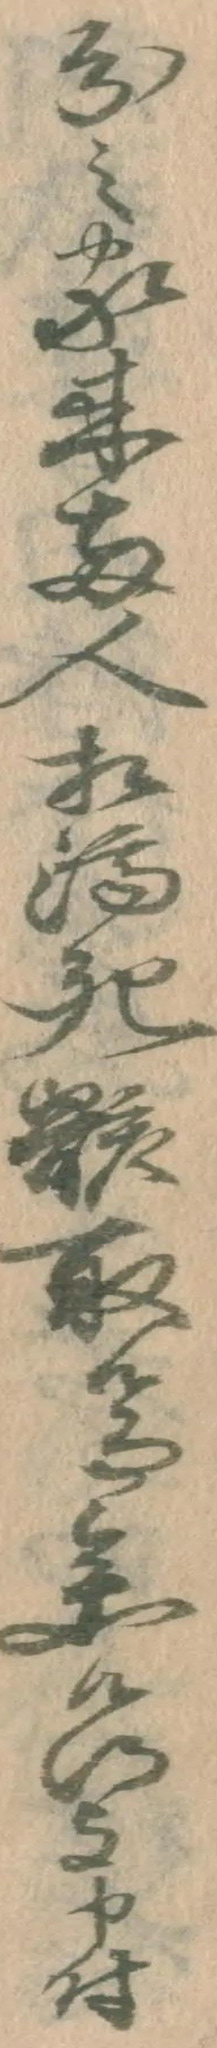分之家来両人相待死骸取候而参候得与申付
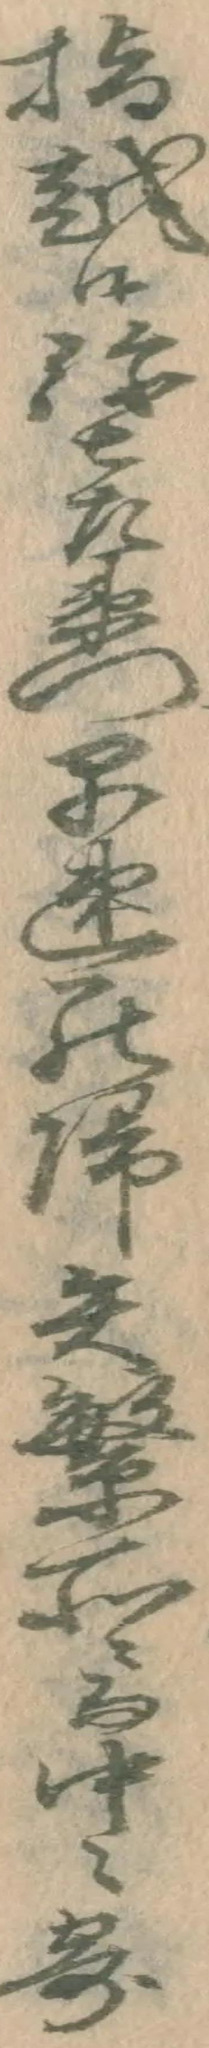指越候弥七左衛門早速罷帰矢繁所に而中々寄
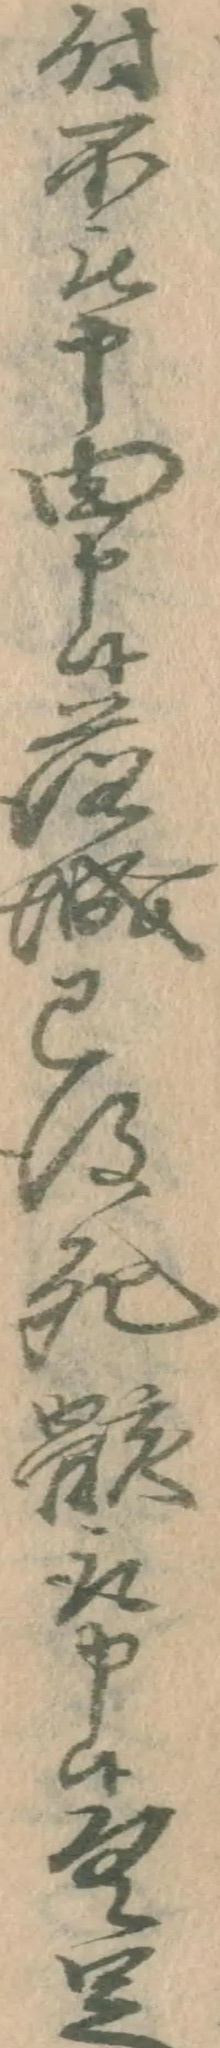付不被申由申候落城已後死骸取申候具足
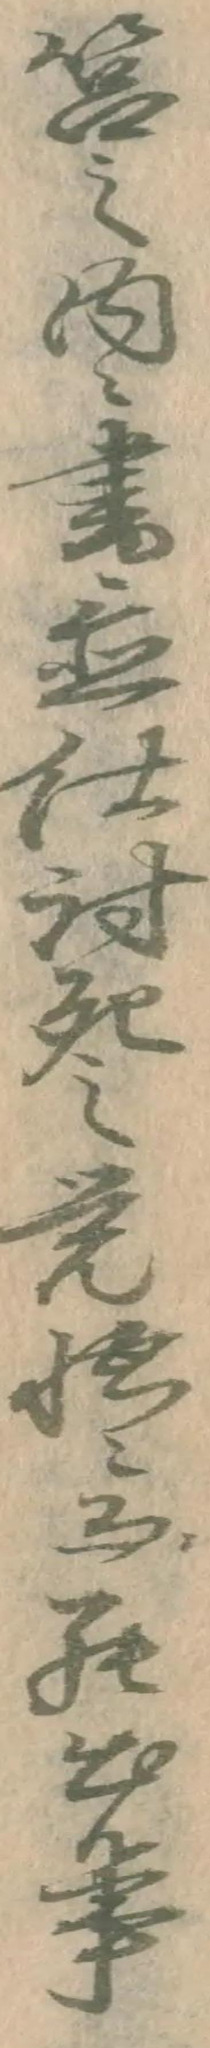筥之内に書置仕討死之覚悟に而罷出候事
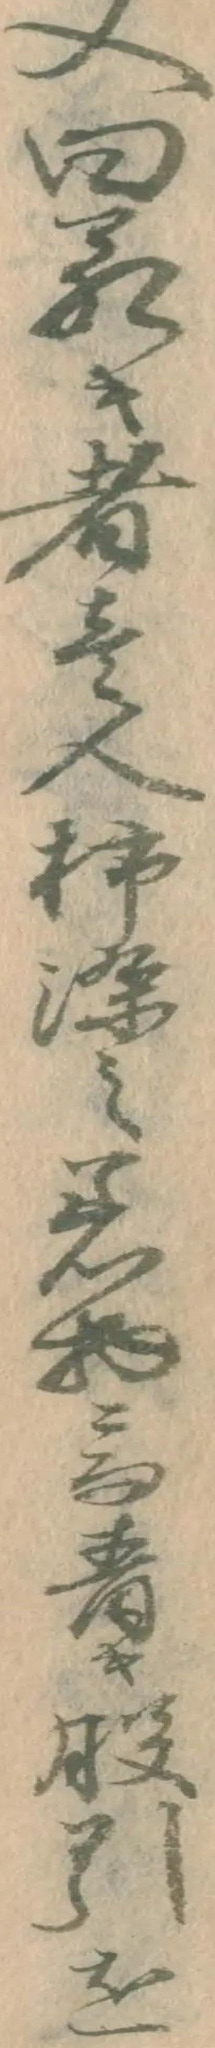又曰若き者壱人柿染之着物に而青き股引を

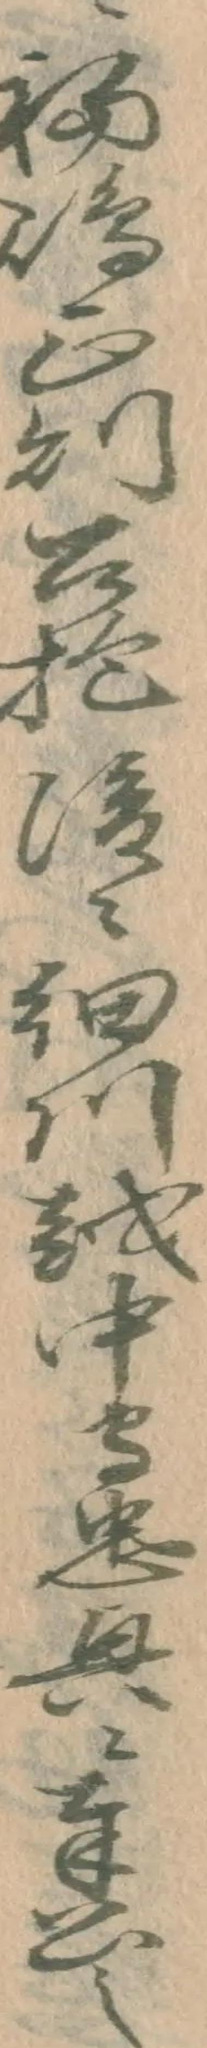に鍋島正則召抱後に細川越中守忠興に奉公し
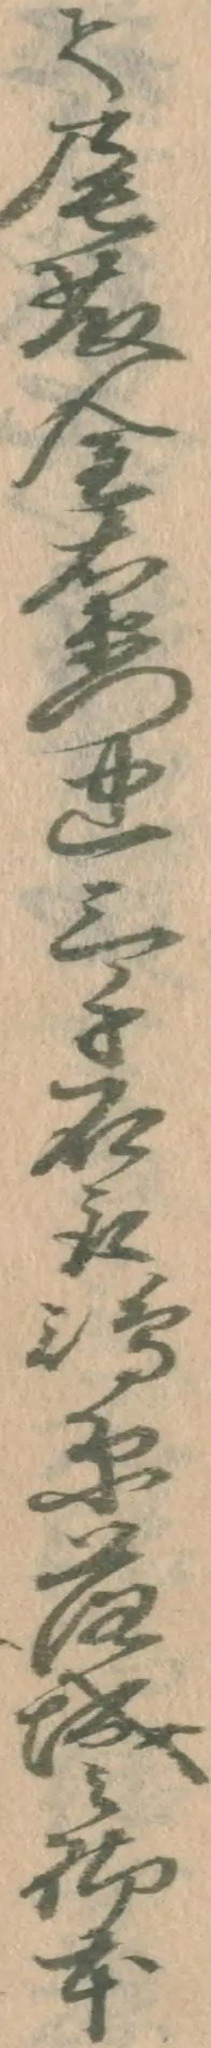て尾藤金右衛門迚三千石取島原落城之砌本
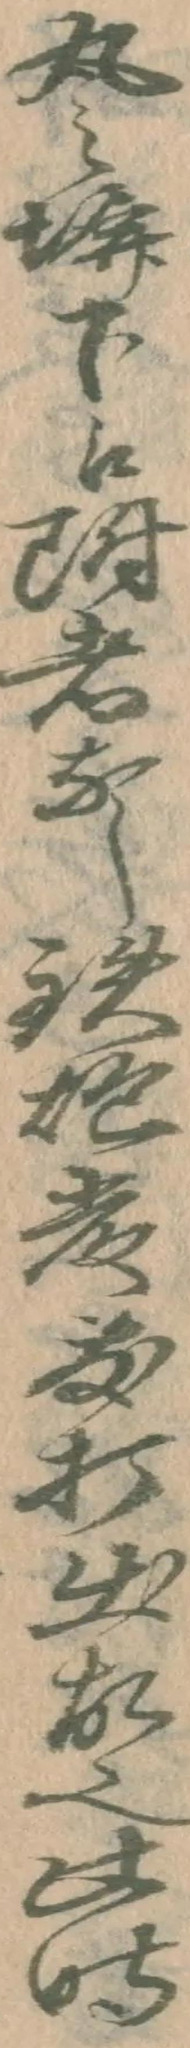丸之塀下江附者なし鉄炮厳敷打出故也此時
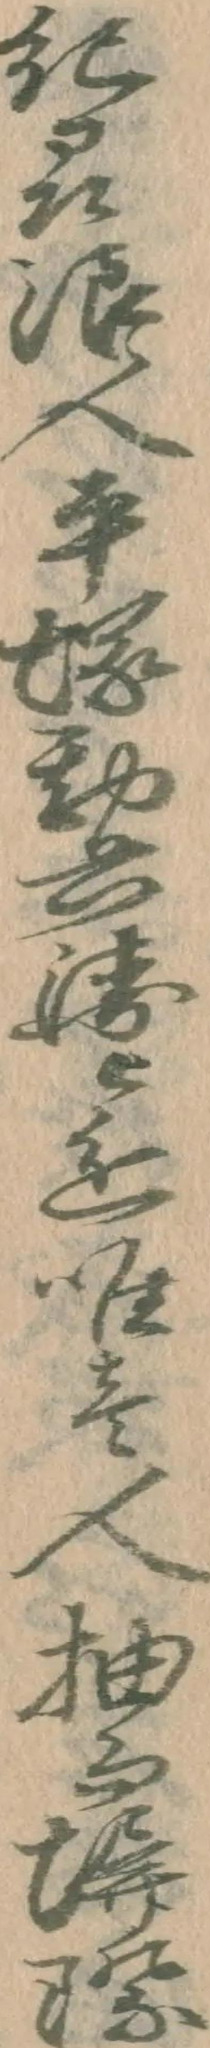紀州浪人平塚勘兵衛被進唯壱人抽而塀際
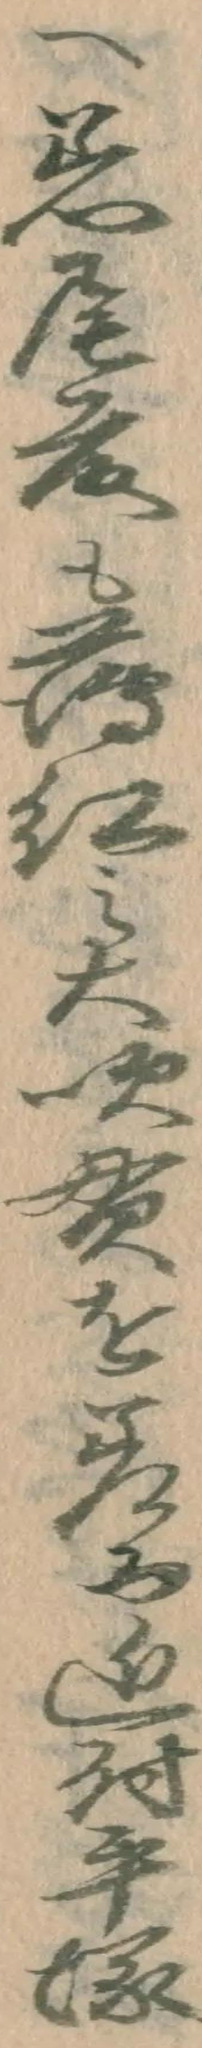へ着尾藤も薄紅之大吹貫を差而近付平塚
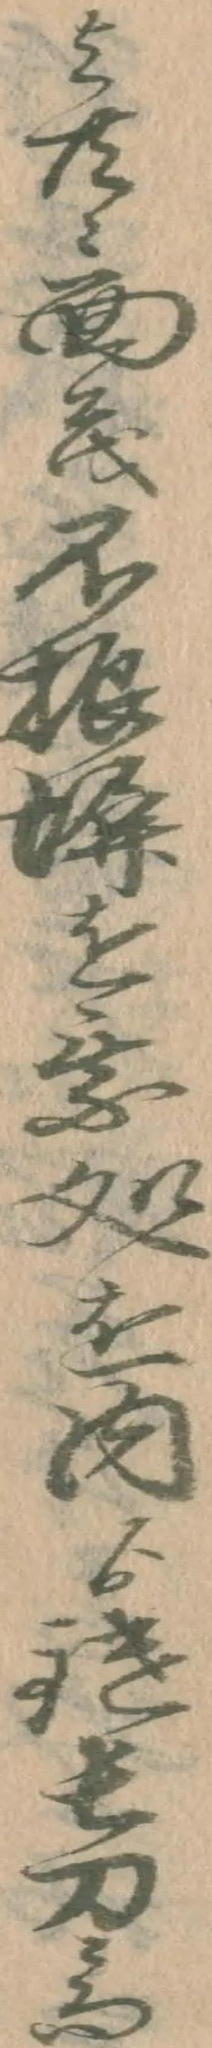与共に面茂不振塀を乗処を内ゟ鑓長刀に而
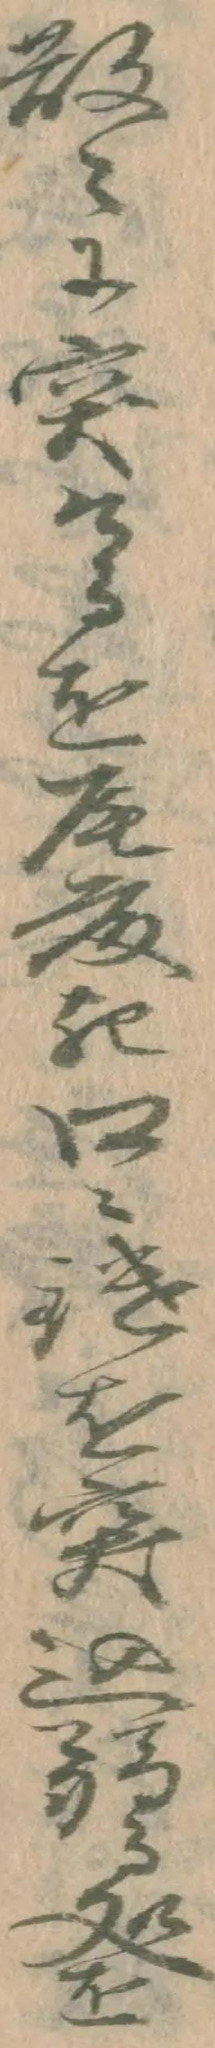散々尓突けるを尾藤歟口に鑓を突込弱る処を
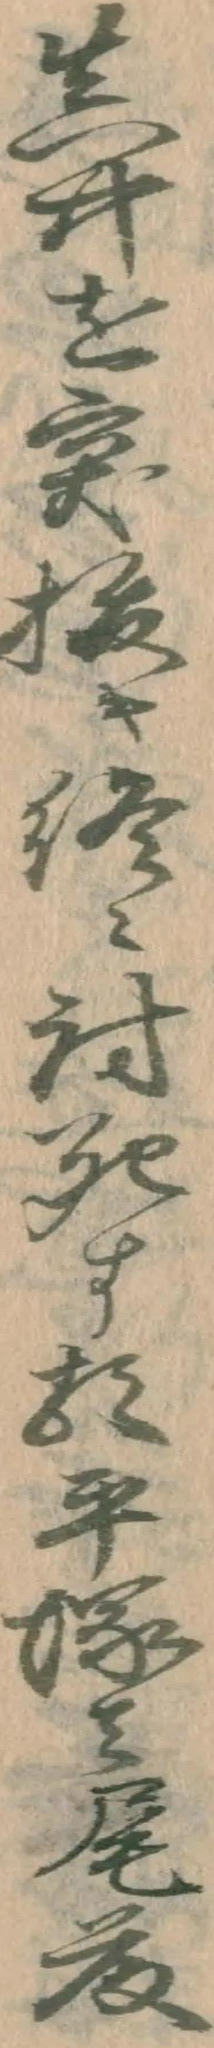真中を突抜き終に討死す類平塚者尾藤
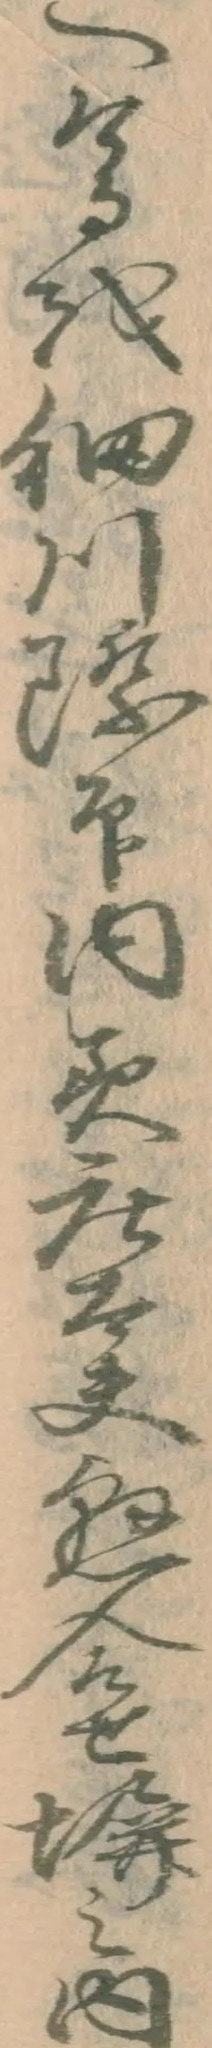へける哉細川際印内美庄太夫懸合せ塀之内
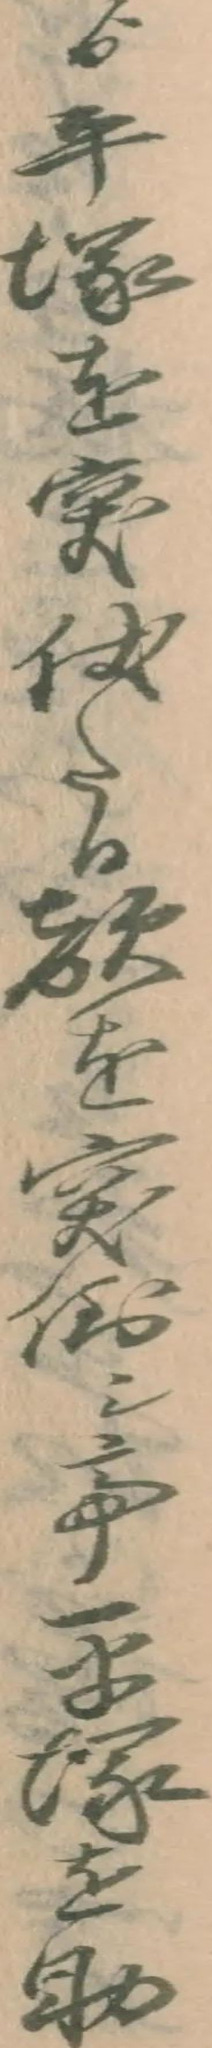ゟ平塚を突伏たる敵を突倒し亭平塚を助
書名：切支丹御退治記 49巻. [8]
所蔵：国立国会図書館 National Diet Library, JAPAN
